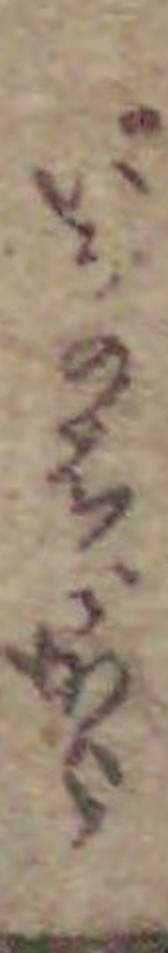いちのはらから
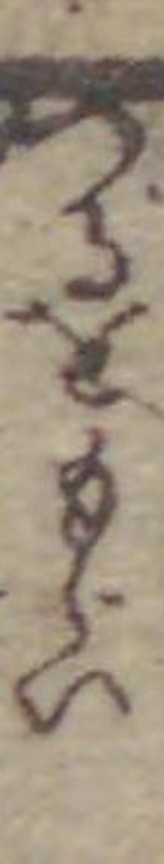づるをもらい
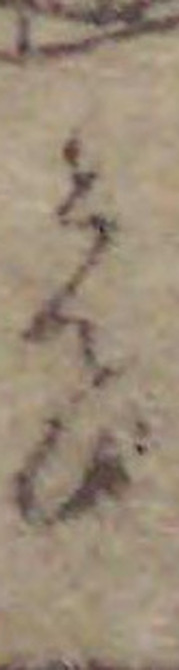とんび
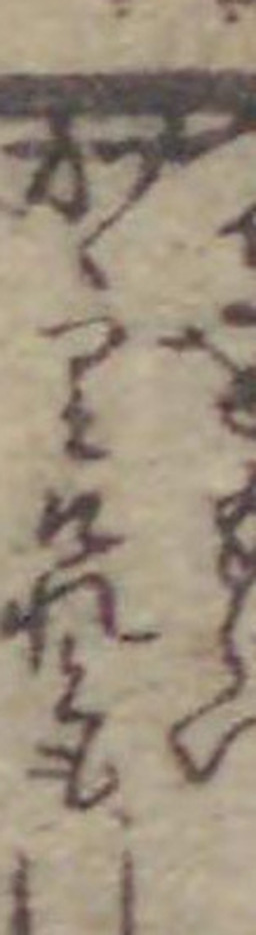かゝりけれとも
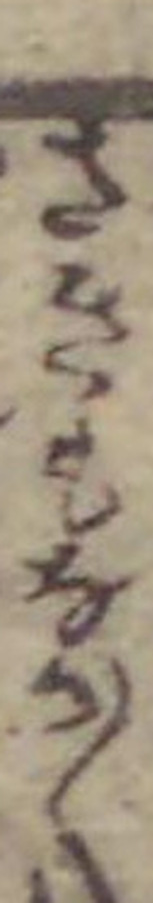さきもなか〳〵
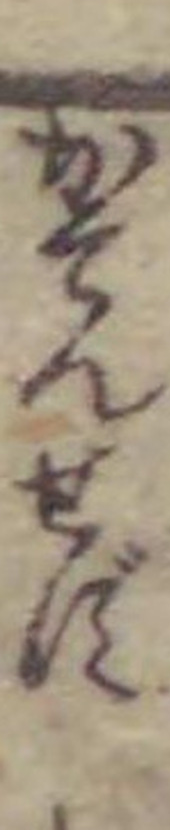かてんせず
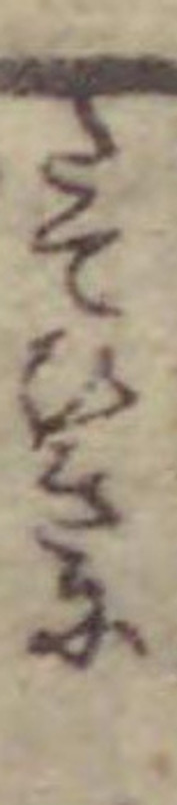たてひきに
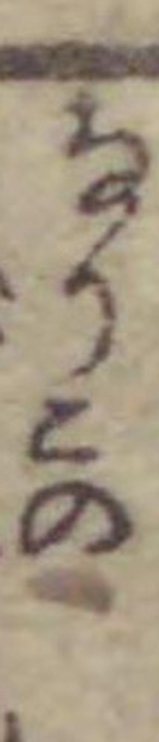なりこの
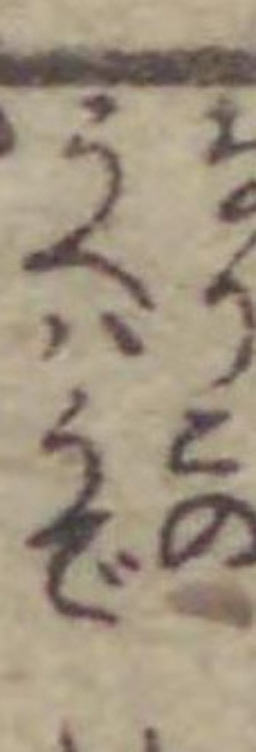うへハうで
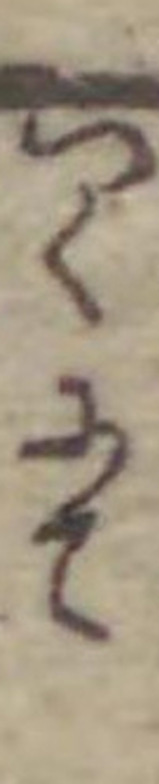つくにて
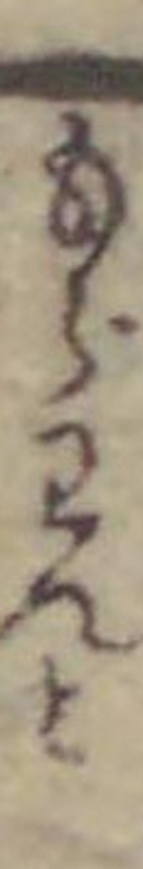もらわんと
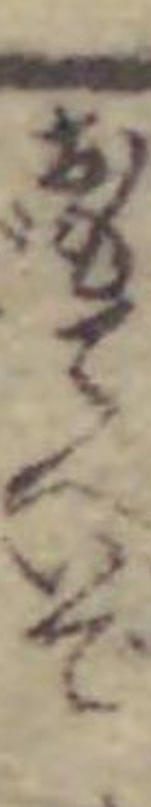おもてへいで
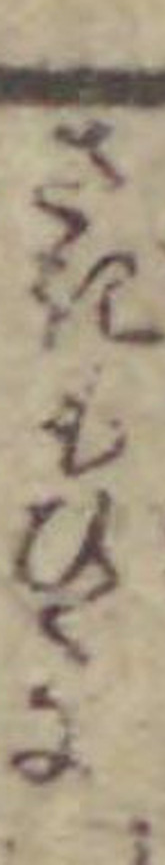さぎもひくに
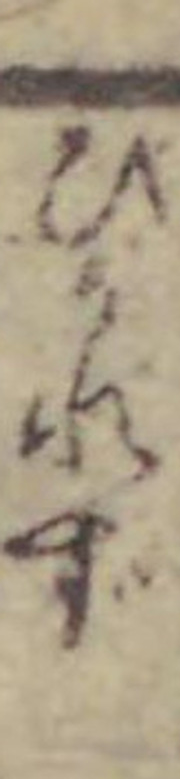ひかれず
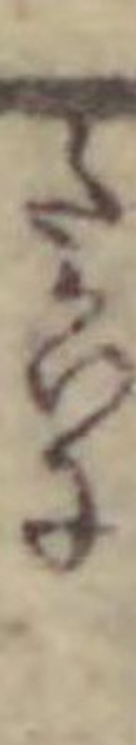たかいに
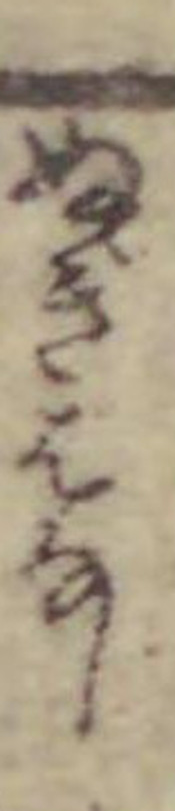ぬきはなし
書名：烏行水諺草 3巻
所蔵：国立国会図書館 National Diet Library, JAPAN
